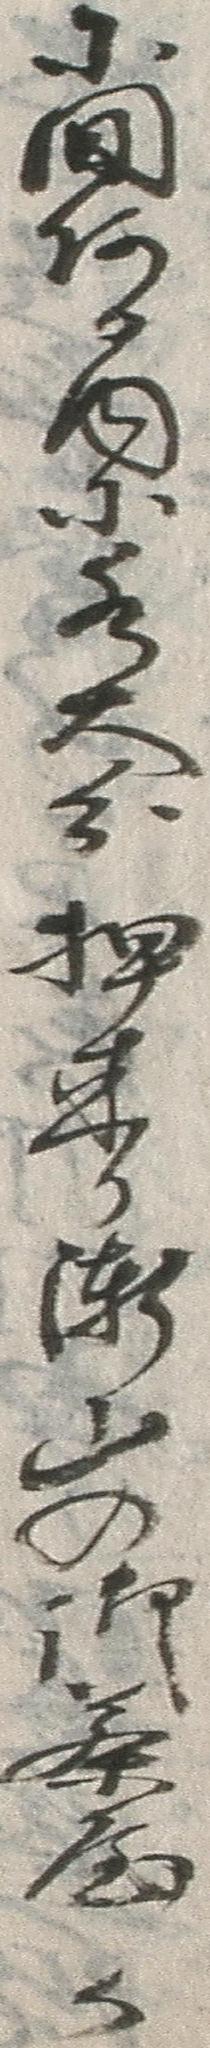に間ある内に水大分押来り漸山の御茶屋か
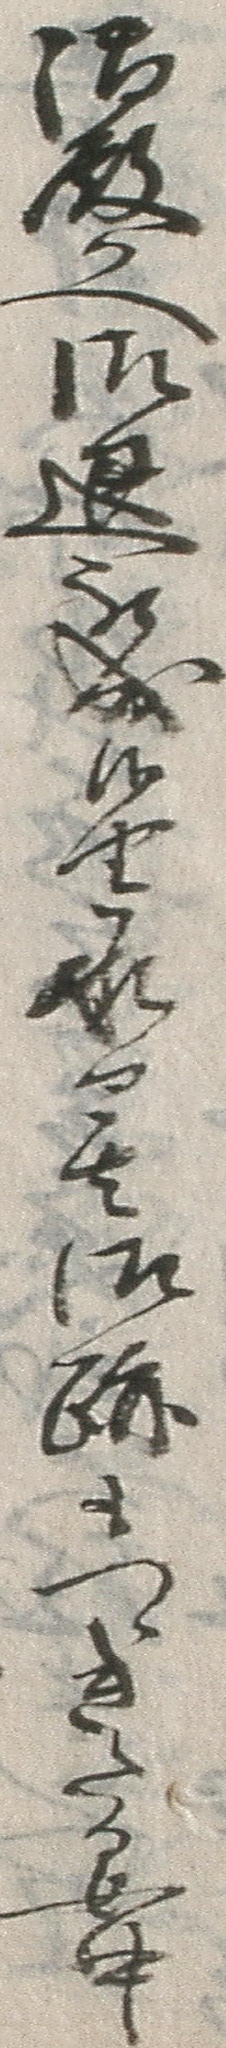御殿かへ御退被成候由承る其御跡もつゝきたる女中
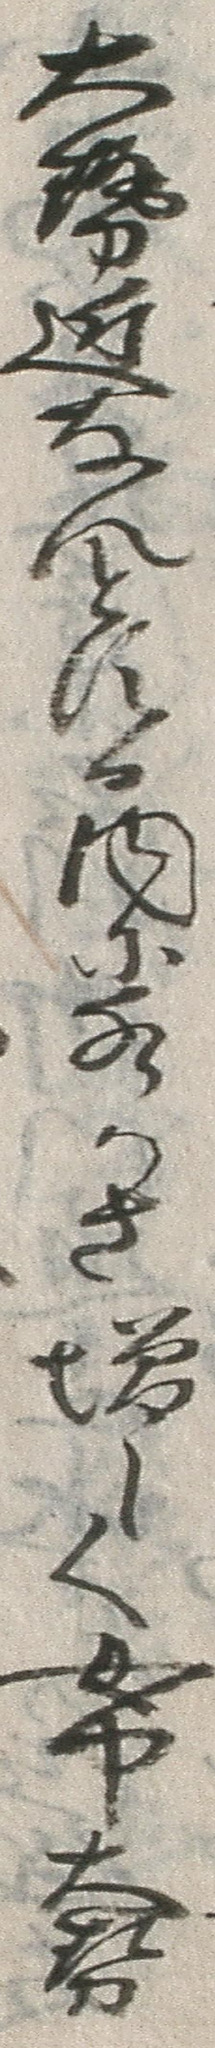大勢近なんとする内に水かさ増し〳〵女中大勢
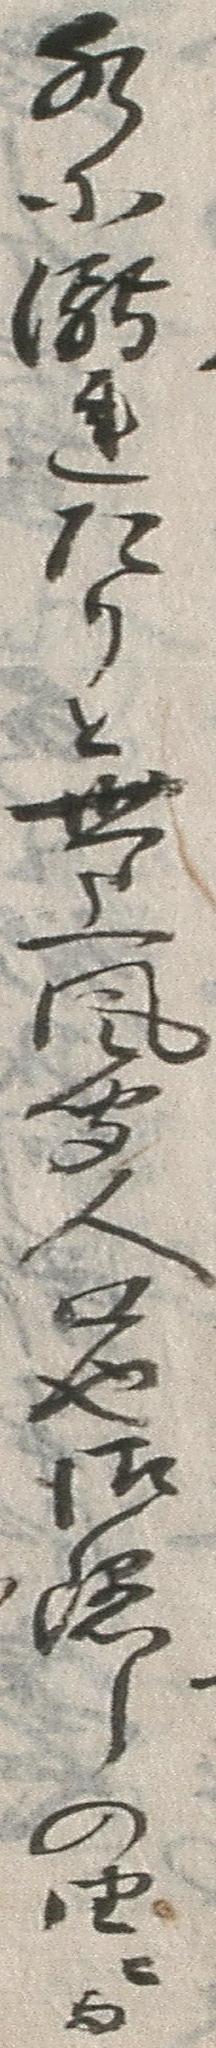水に溺れたりと世上風聞人口也御隠しの由に而
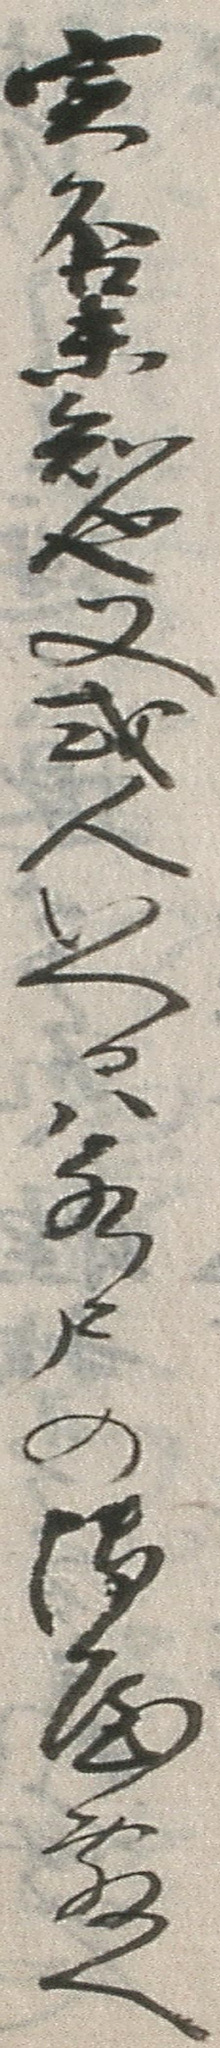実否未知也又或人いへるは水戸の御屋敷へ
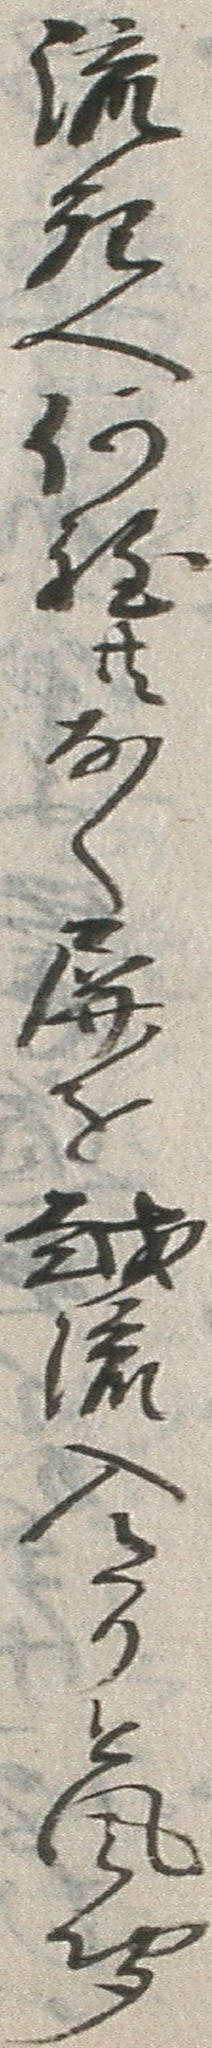流死人何程共なく屏を越流入たりと風聞
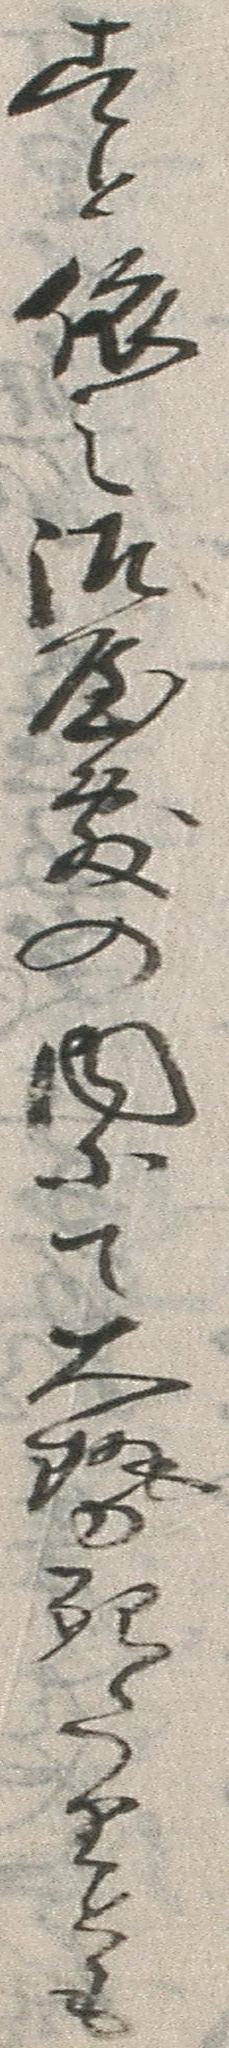すと依之御屋敷の内にて大勢死たりとも
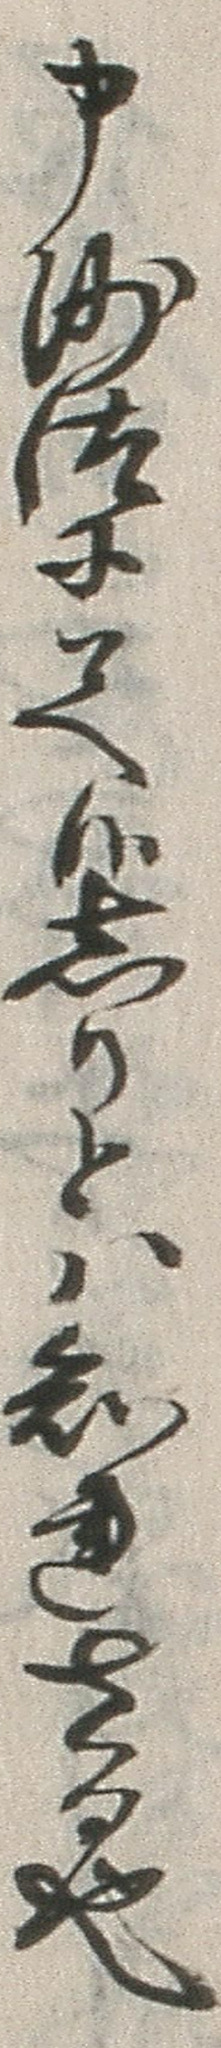申沙汰にて候しりとは知れさる也
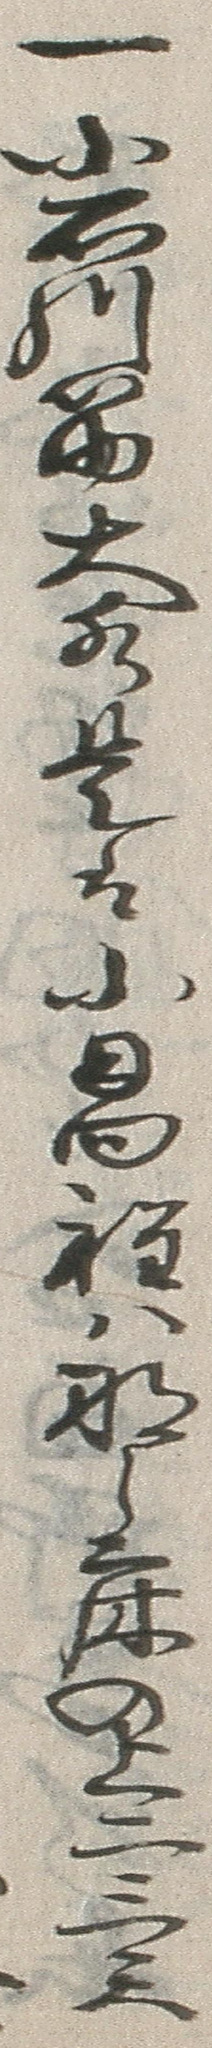一小石川筋大水是は小日向程はなし床の上二三尺
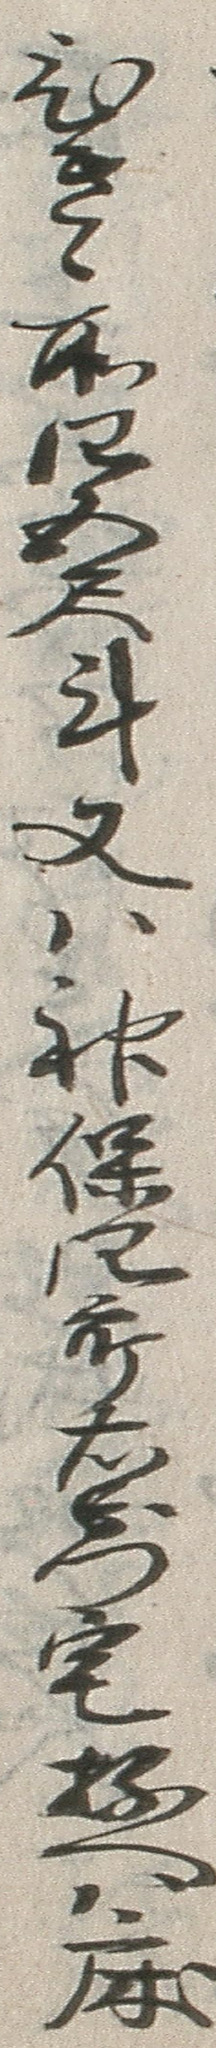ひきゝ所四五尺計又は神保四郎右衛門宅抔へは床
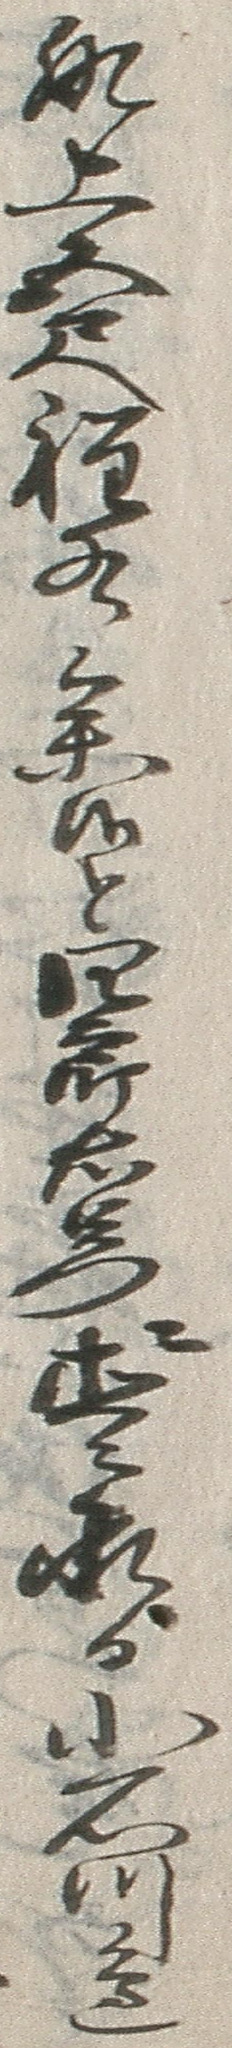の上五尺程水参候と四郎右衛門に直に承ゟ小石川辺
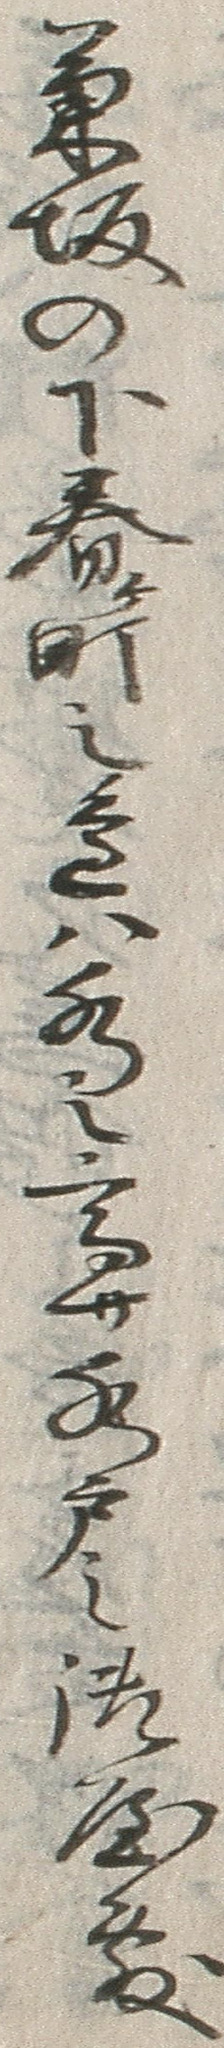菊坂の下春ヶ町之辺は水之高サ水戸之御屋敷
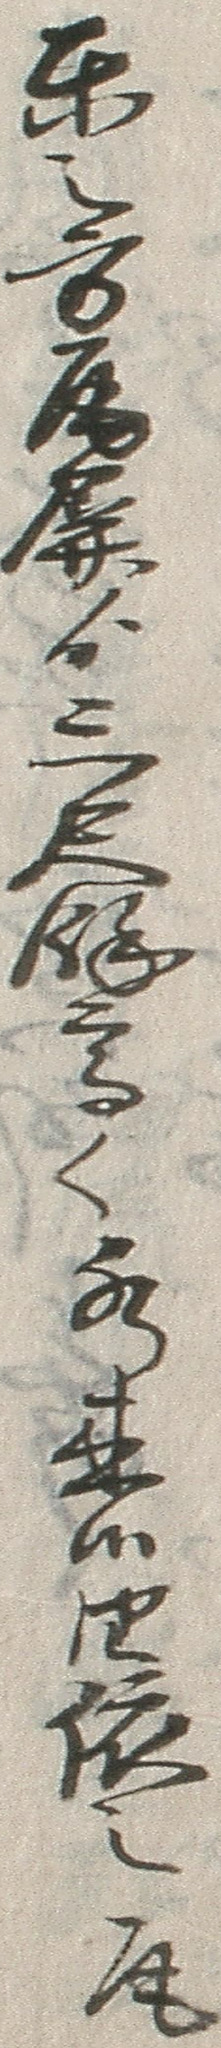東之方瓦屏ゟ三尺余高く水来候由依之瓦
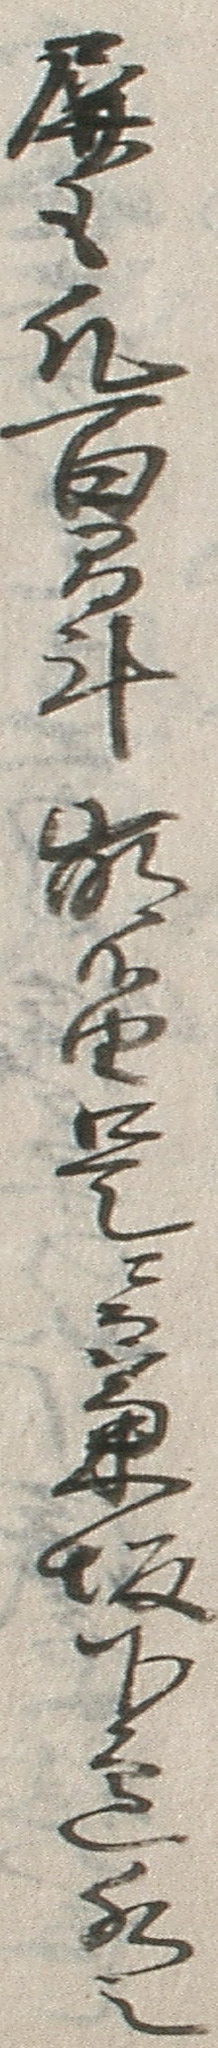屏も凡百間計崩候由是に而菊坂下辺水之
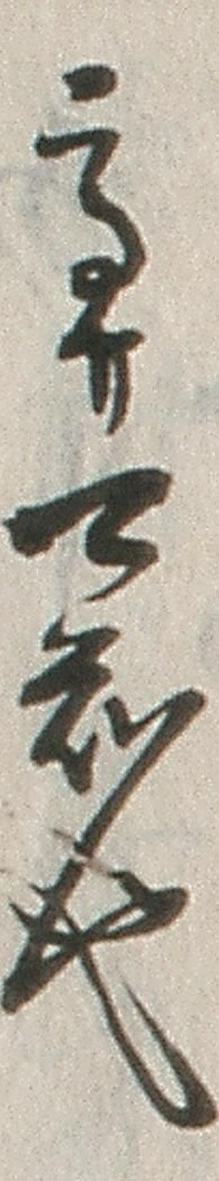高サ可知也
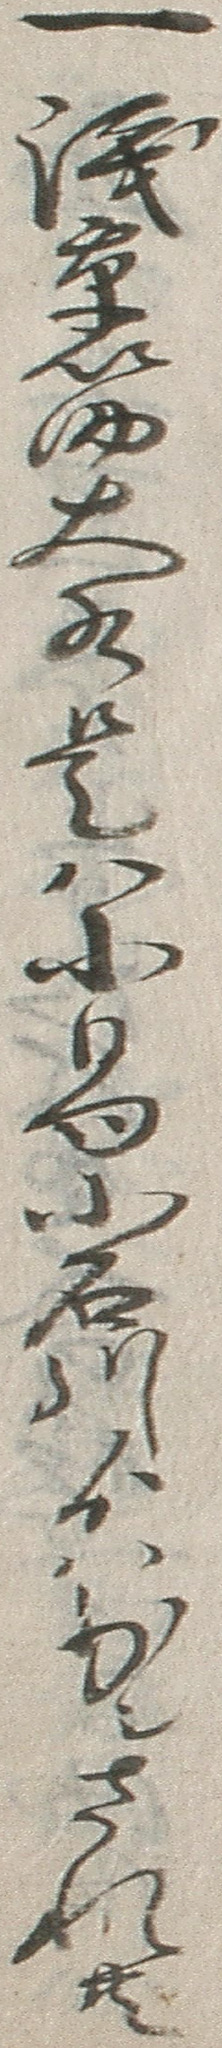一浅草筋大水是は小日向小石川ゟは少シされ共
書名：享保十三年江戸洪水記
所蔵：東京大学地震研究所図書室 Earthquake Research Institute Library, The University of Tokyo, JAPAN
